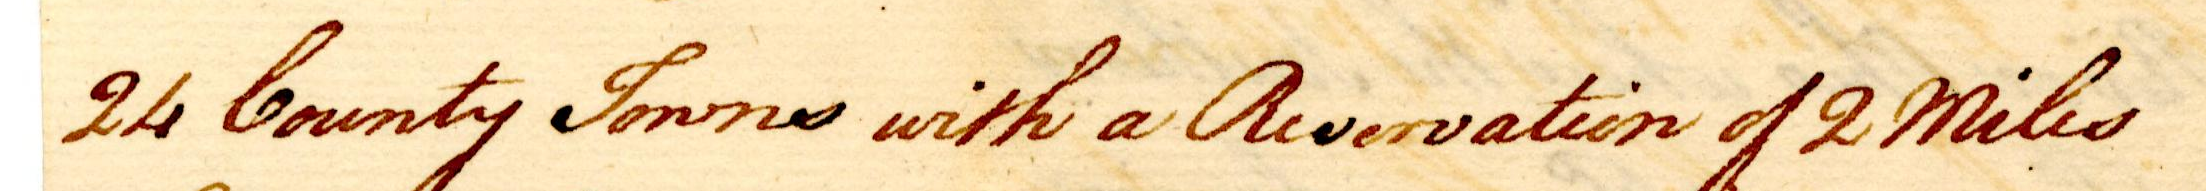24 County Towns with a Reservation of 2 Miles
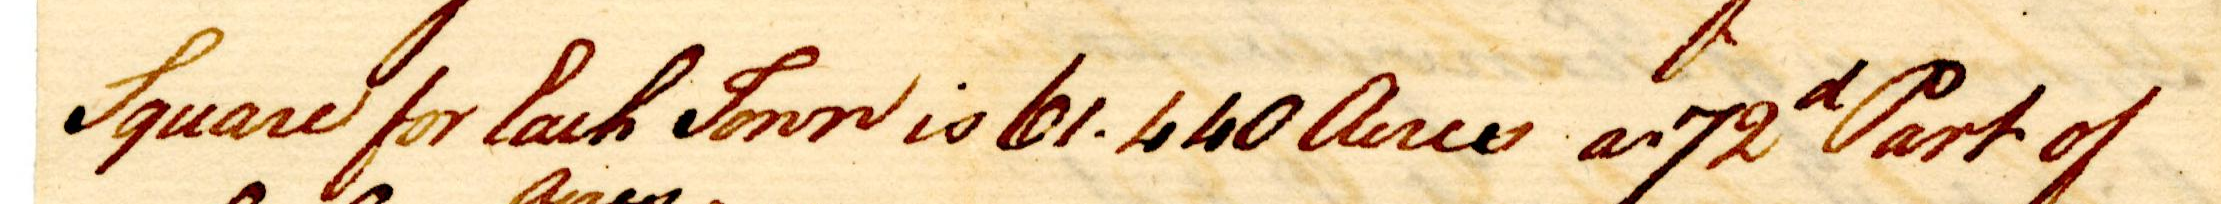Square for Each Town is 61.440 Acres as 72^d. Part of
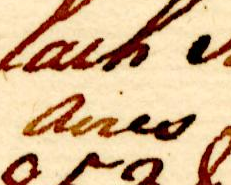acres
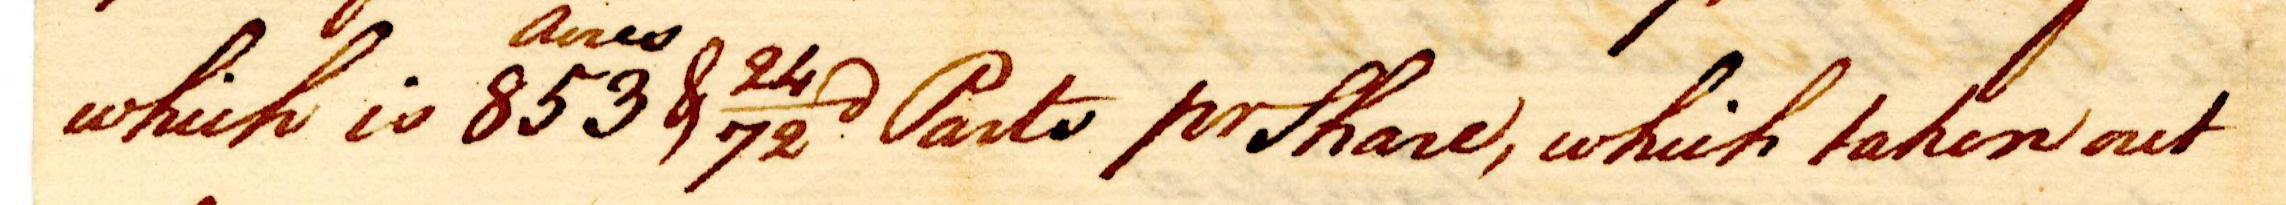which is 853 & 24/72^d Parts pr Share, which taken out
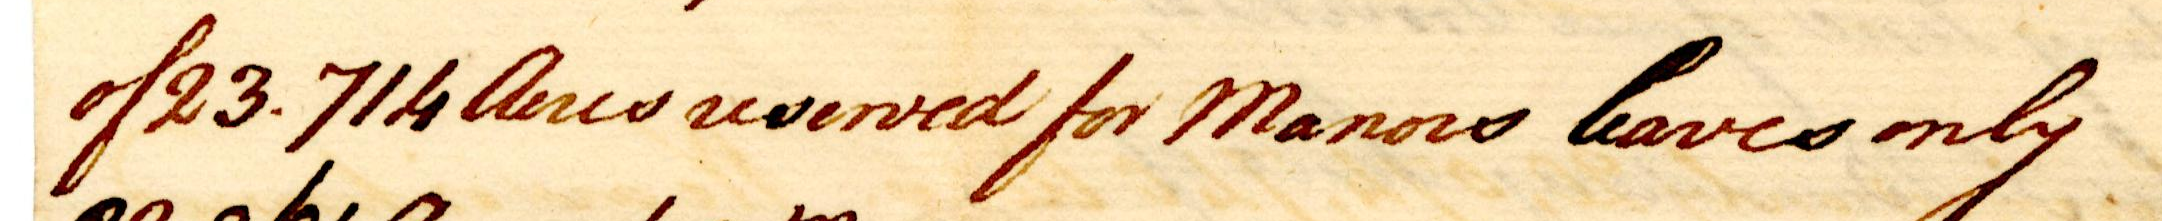of 23.714 acres reserved for Manors leaves only
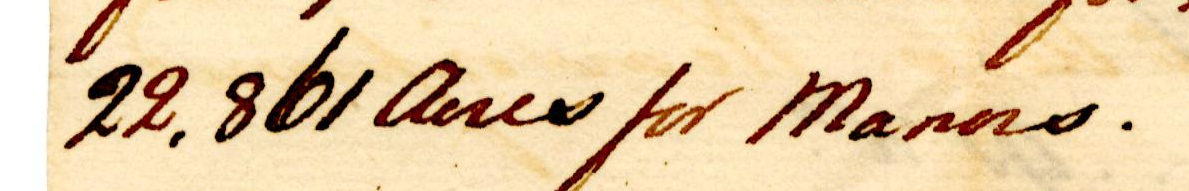22,861 Acres for Manors.
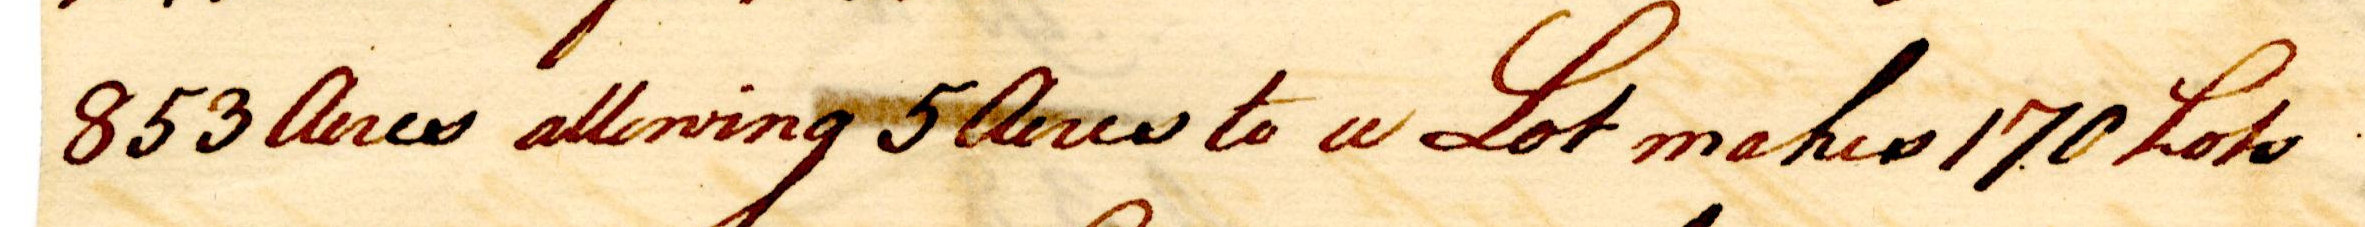853 acres allowing 5 acres to a Lot makes 170 lots
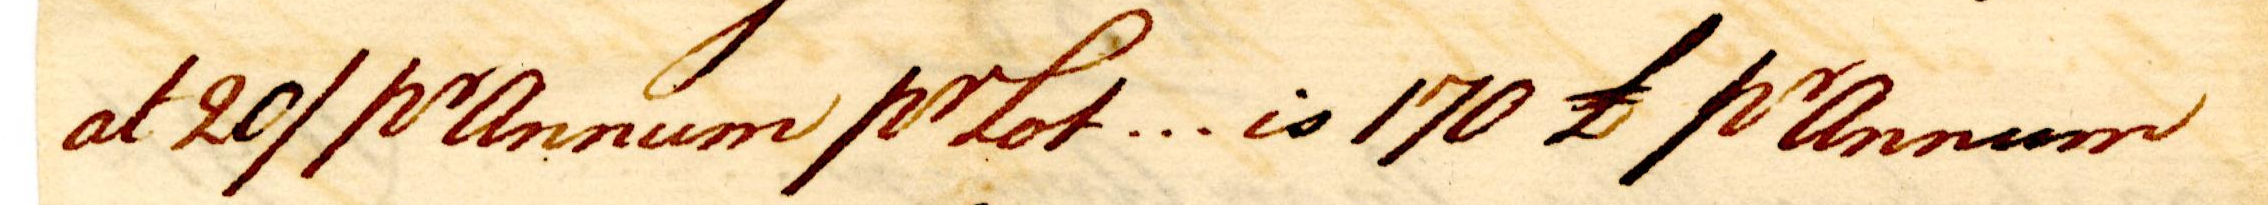at 20s p^r Annum p^r Lot... is 170 £ p^r annum
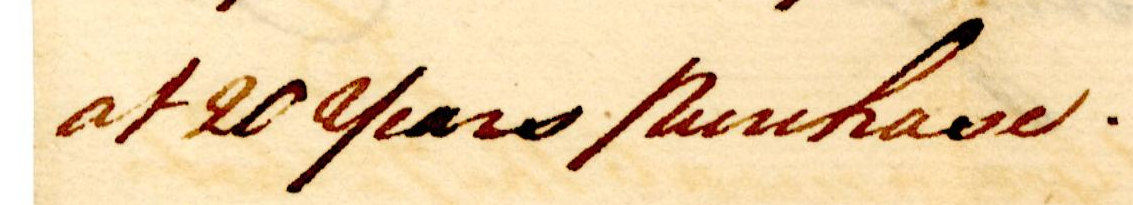at 20 years purchase.
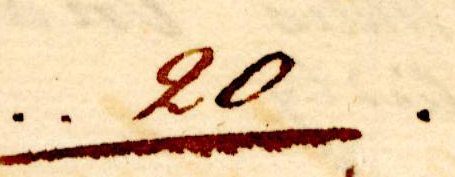20
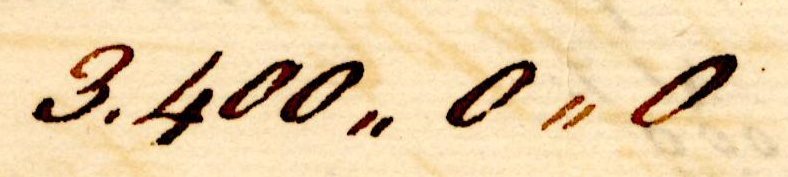3,400.0.0
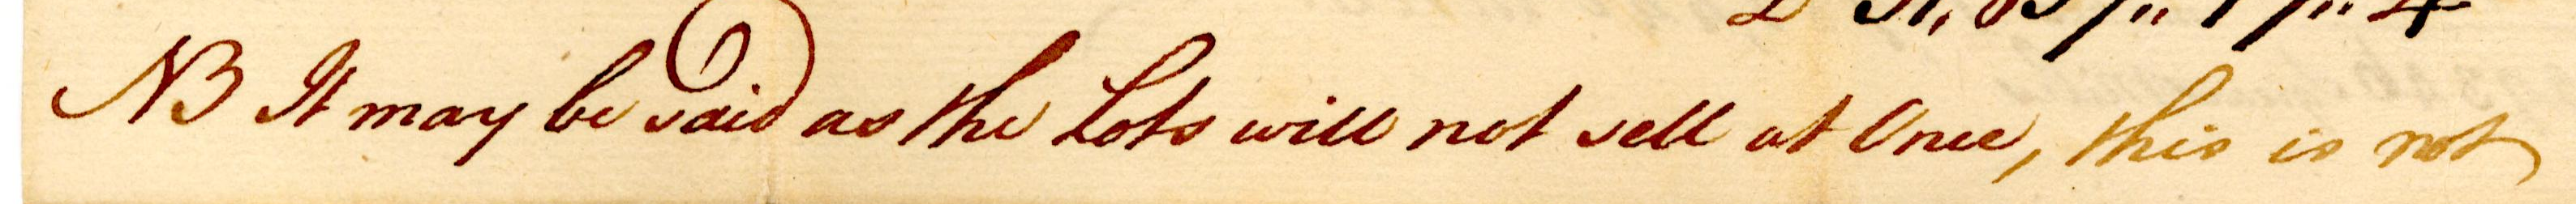B it may be said as the Lots will not sell at Once, this is not
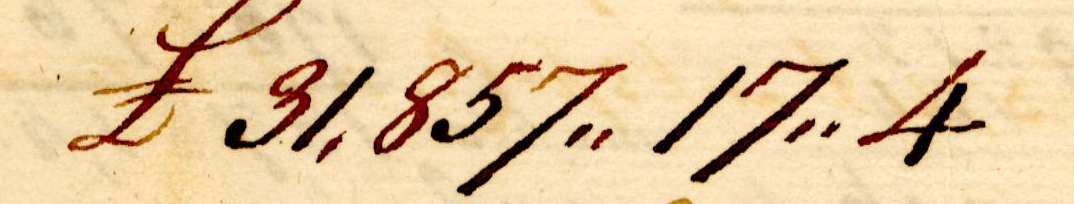£31,857.17.4
